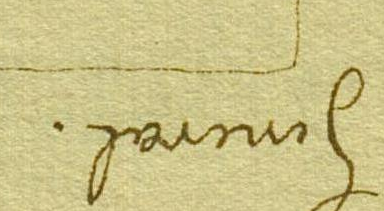General.
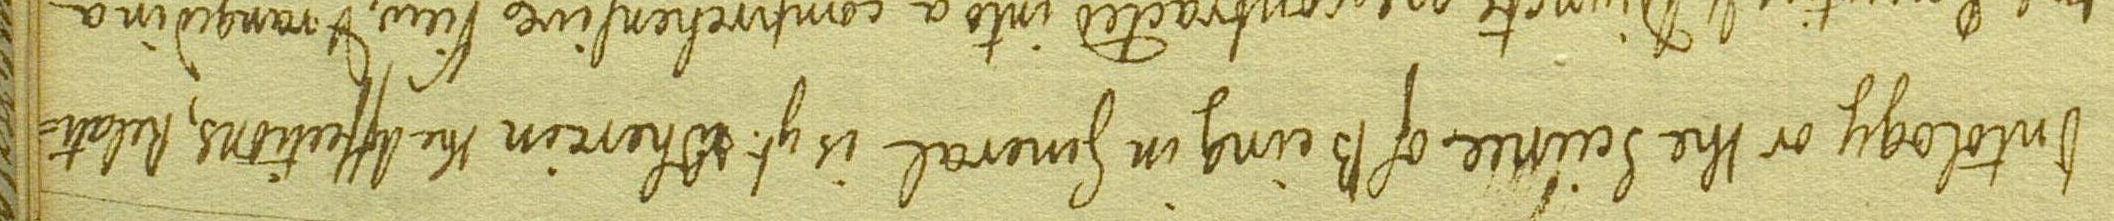Ontology or the Science of Being in General is y^t wherein the Affections, Relati-
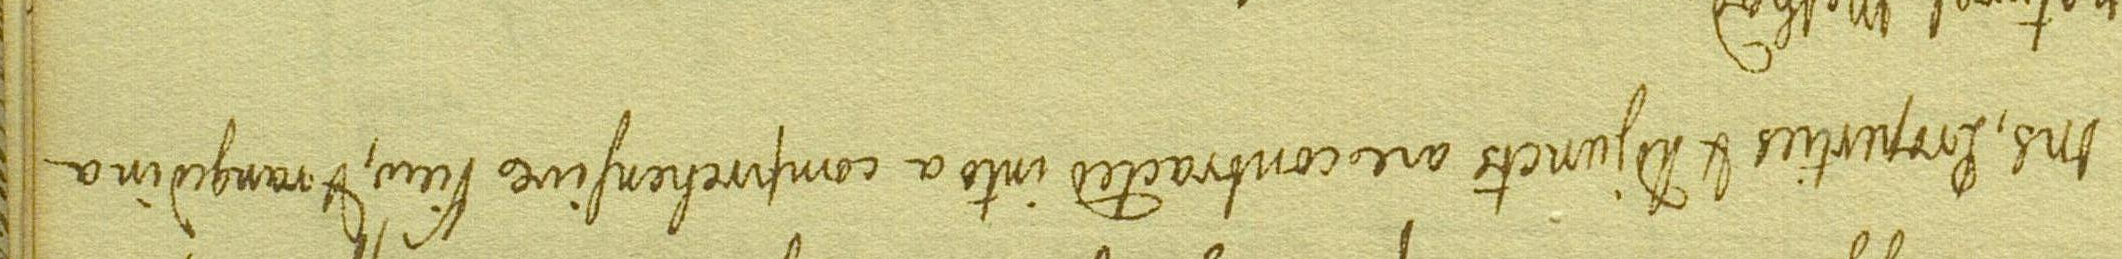ons, Properties & Adjuncts are contracted into a comprehensive View, & ranged in a
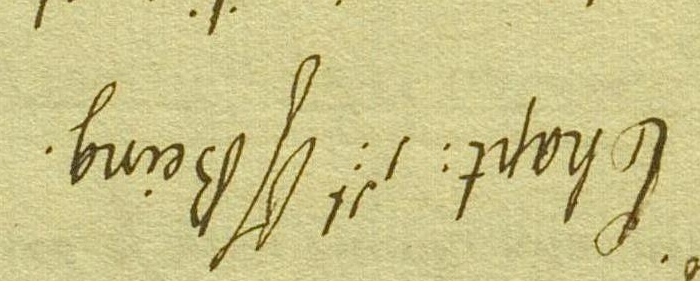Chapt: 1^st: Of Being.
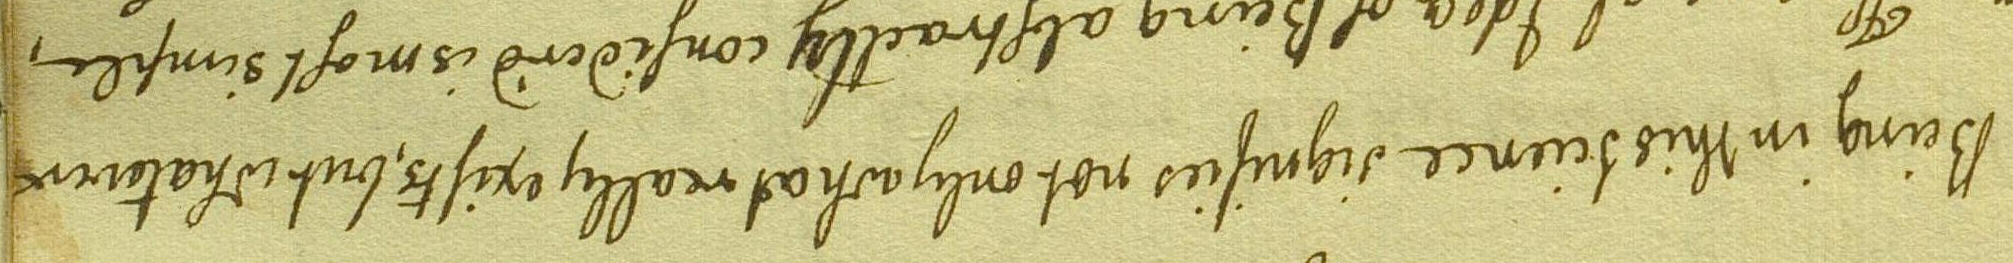Being in this Science signifies not only what really exists, but whatever
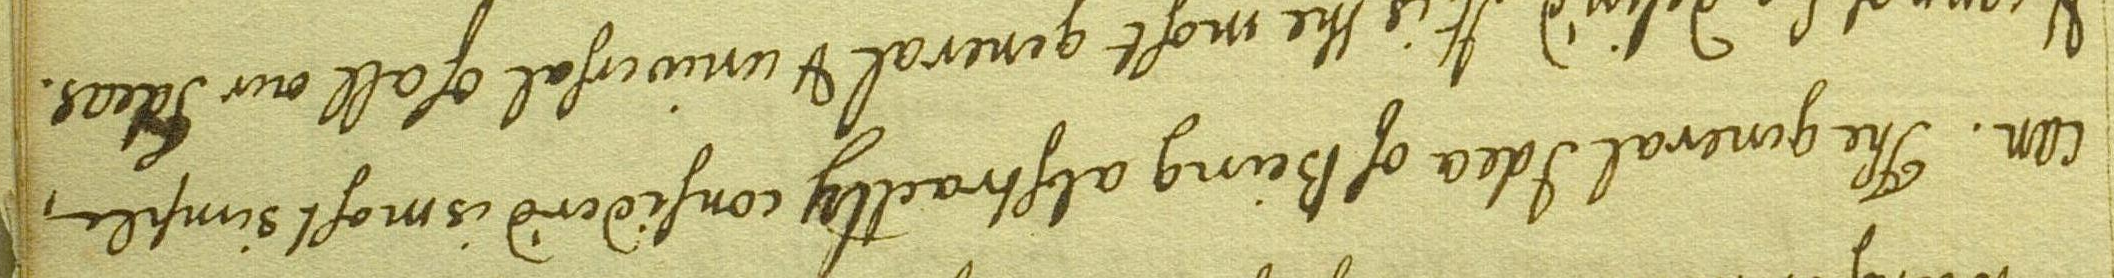can. The general Idea of Being abstractly consider'd is most simple,
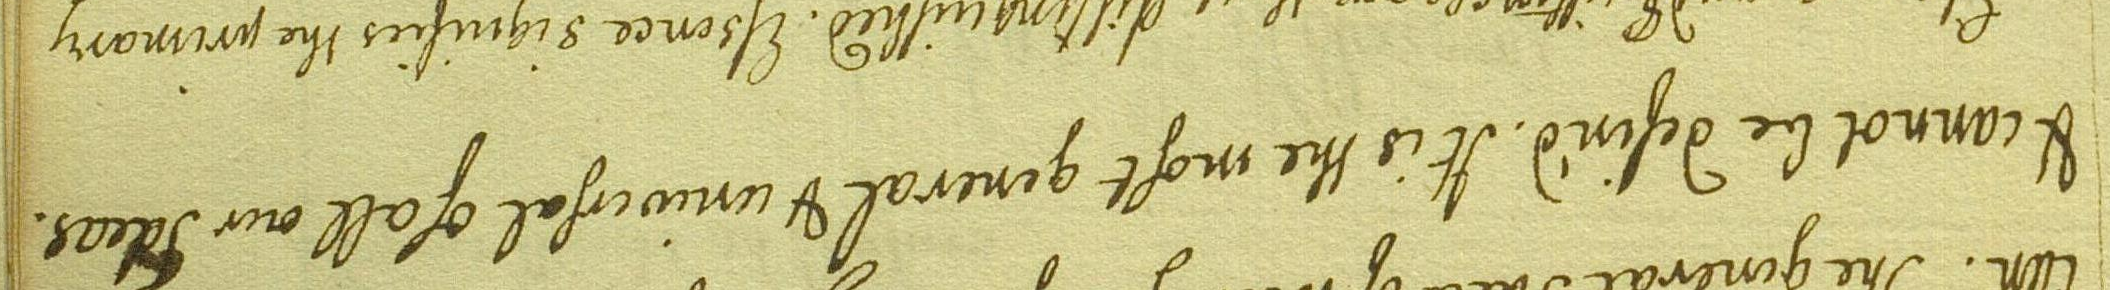& cannot be defin'd. It is the most general & universal of all our Ideas.
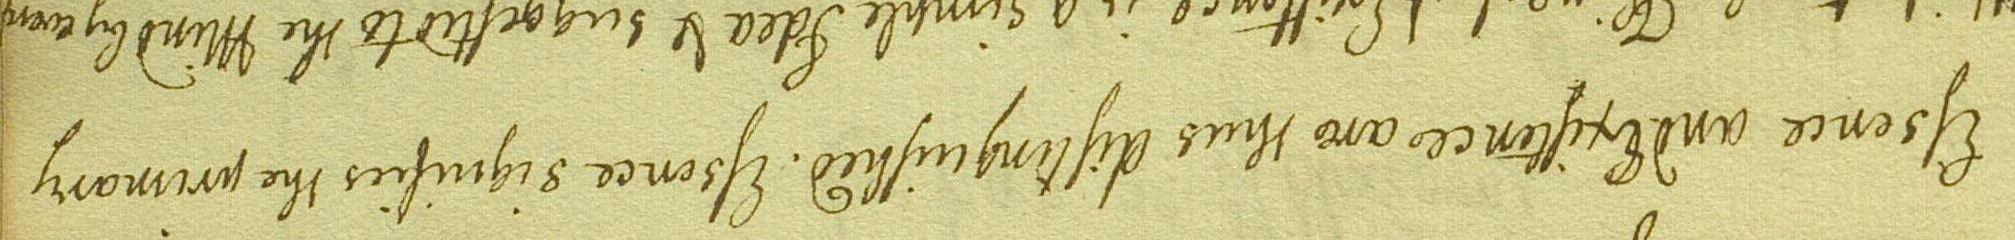Essence and existence are thus distinguished. Essence signifies the primary
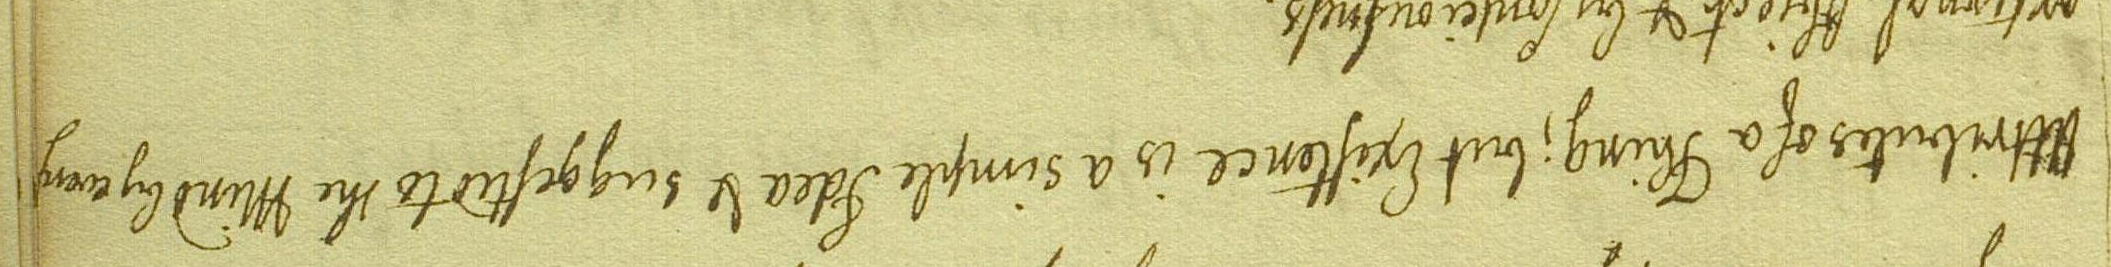Attributes of a Thing; but Existence is a simple Idea & suggested to the Mind by every
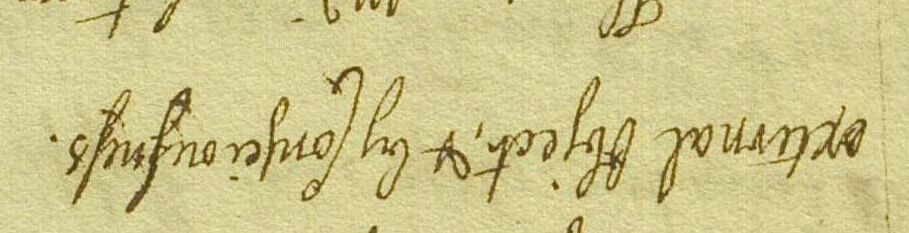external Object, & by Consciousness.
